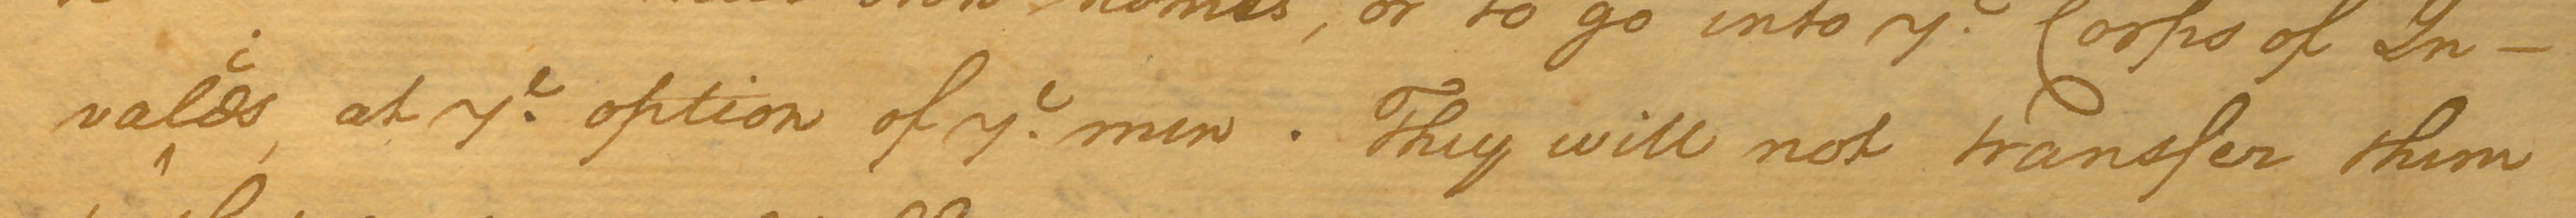val^ids, at y^e. option of y^e. men. They will not transfer them
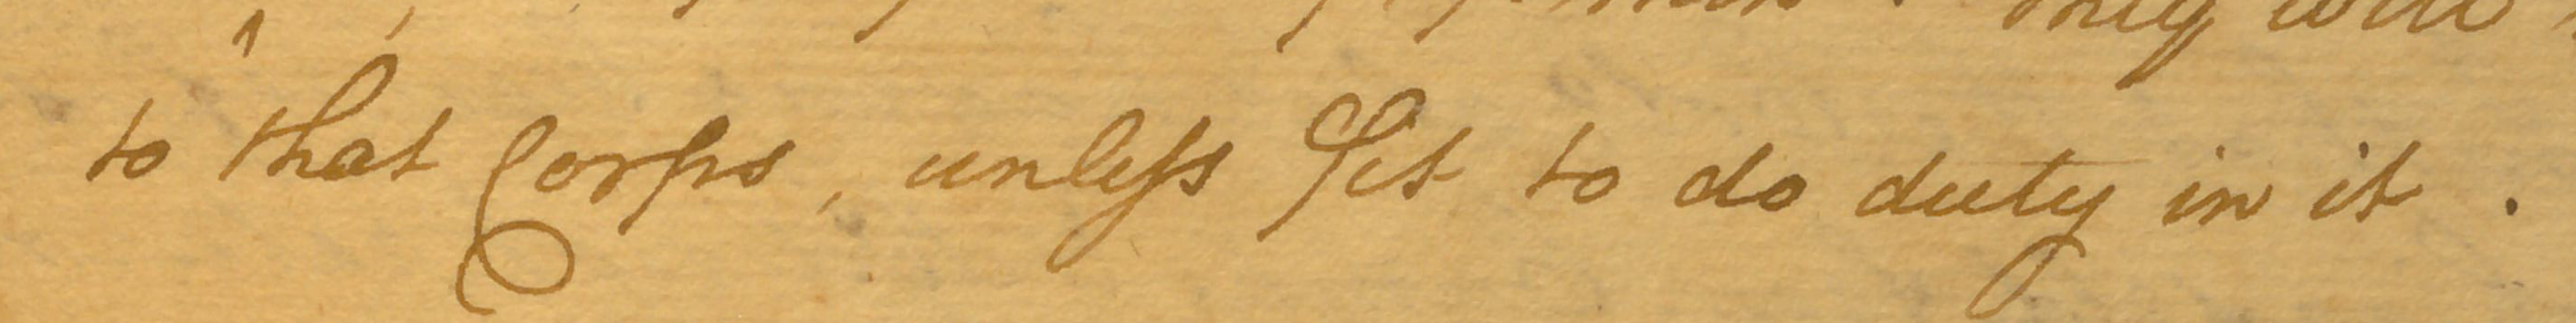to that Corps, unless fit to do duty in it.
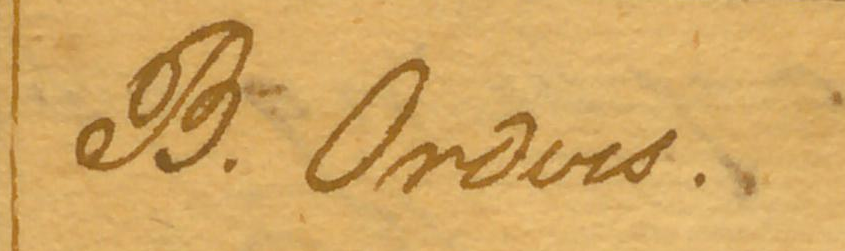B. Orders.
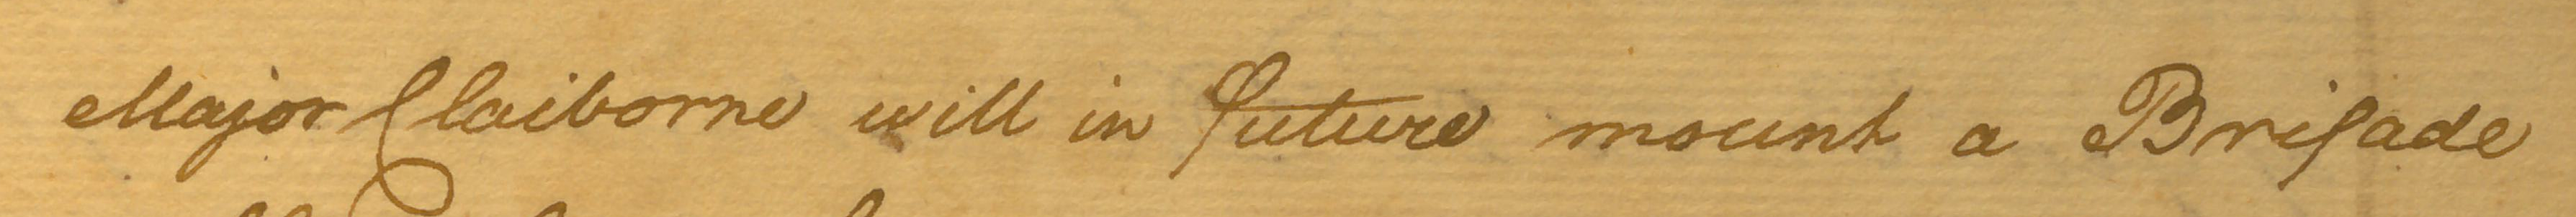Major Claiborne will in future mount a Brigade
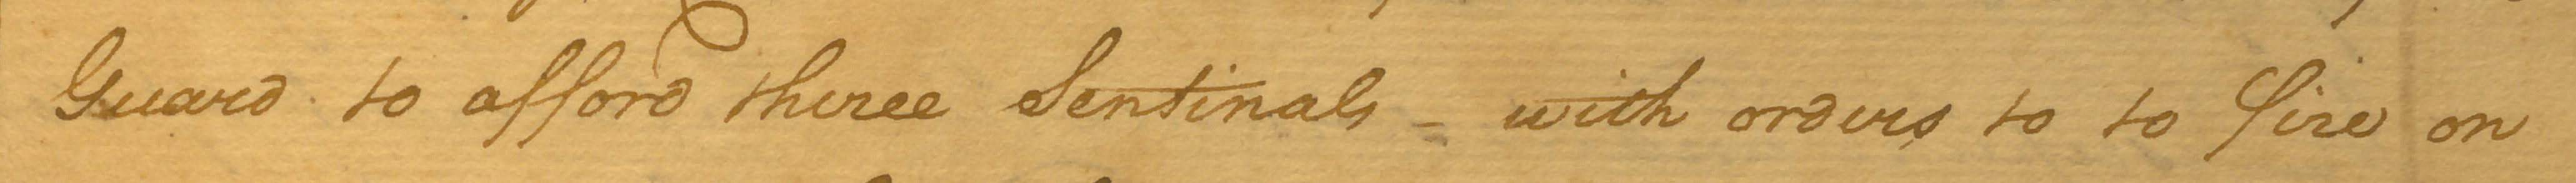Guard to afford theree Sentinals- with orders to to fire on
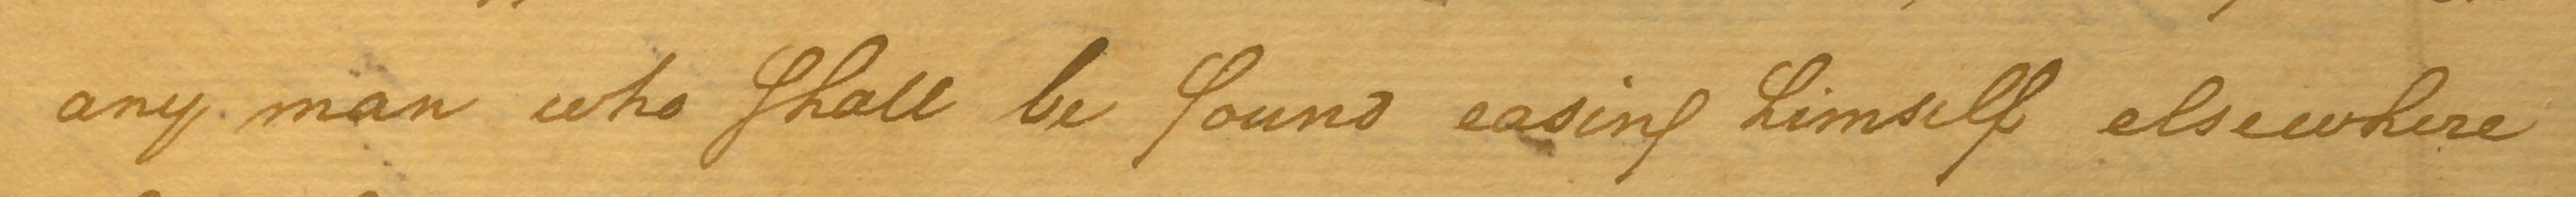any man who shall be found easing himself elsewhere
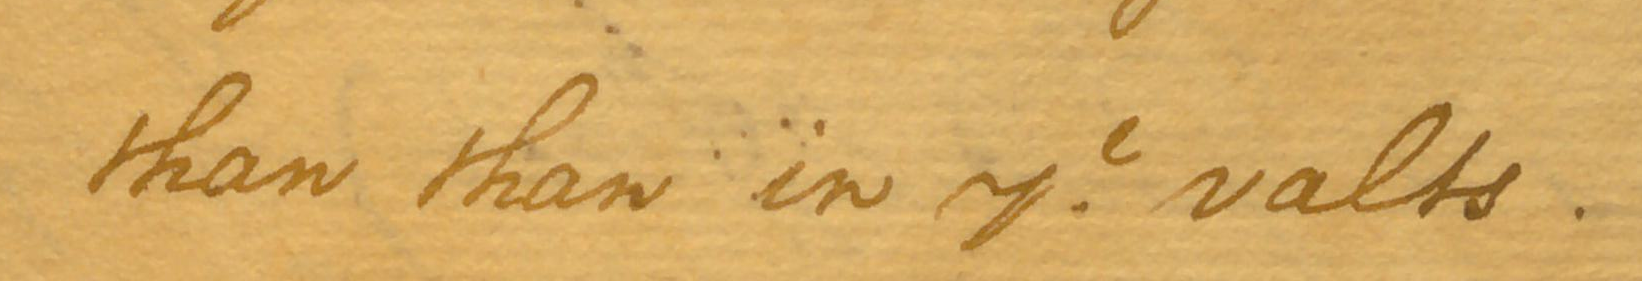than than in y^e. valts.
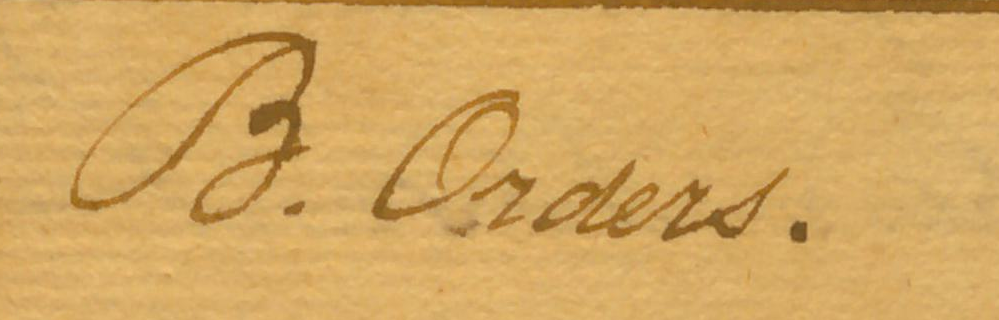B. Orders.
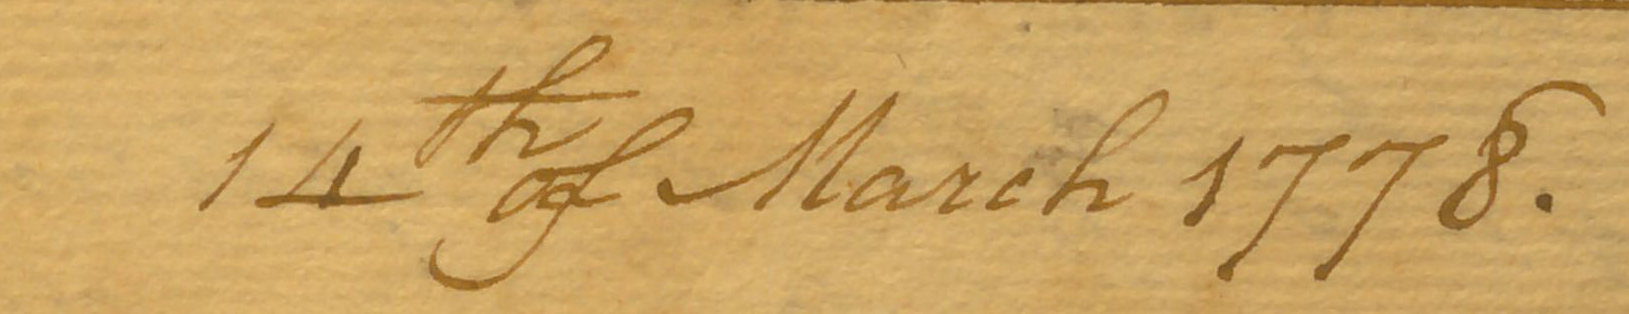14^th of March 1778.
